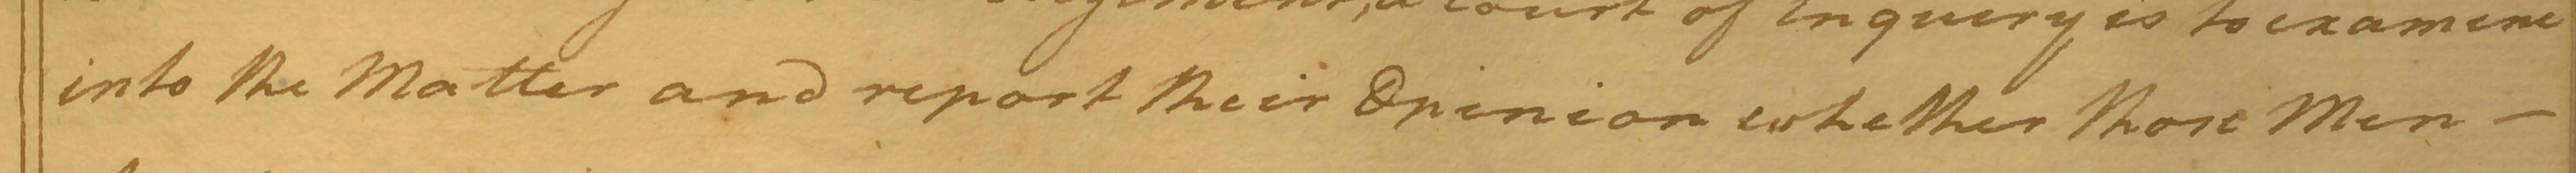into the Matter and report their Opinion whether those Men
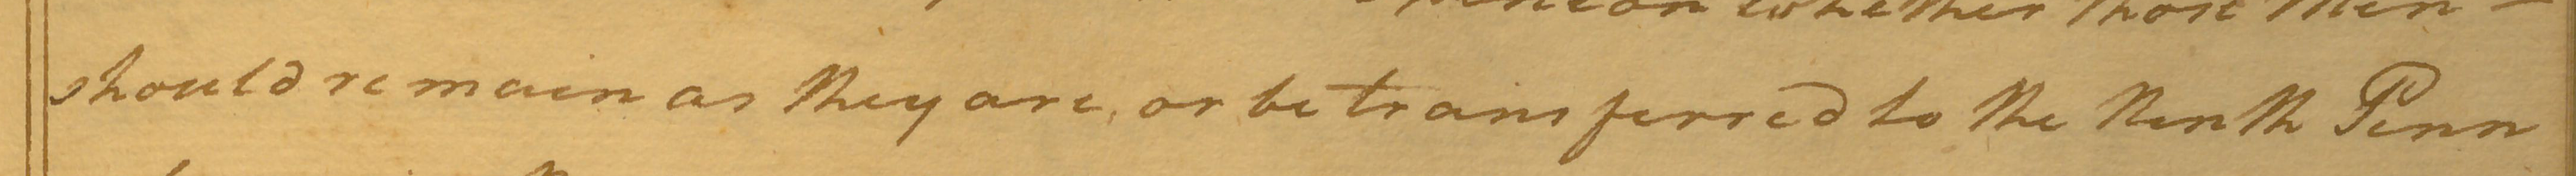should remain as they are or be transferred to the Ninth Penn
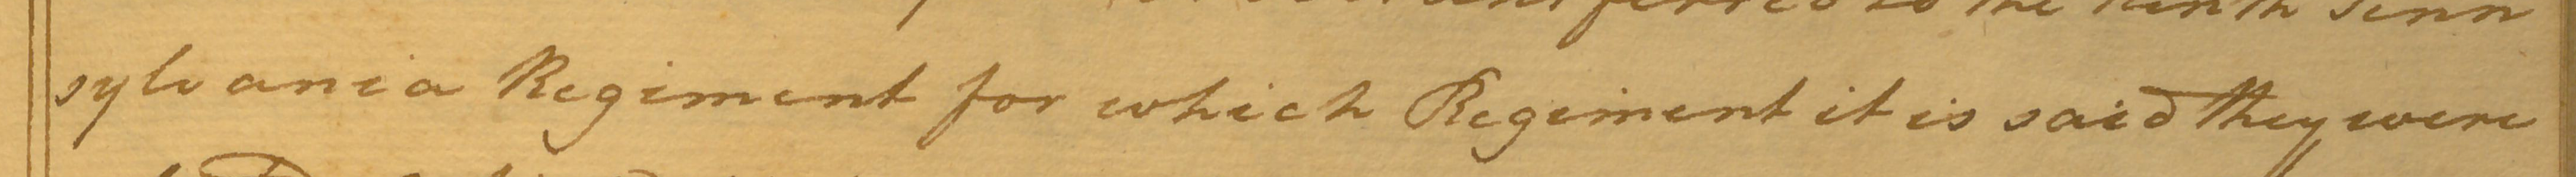sylvania Regiment for which Regiment it is said they were
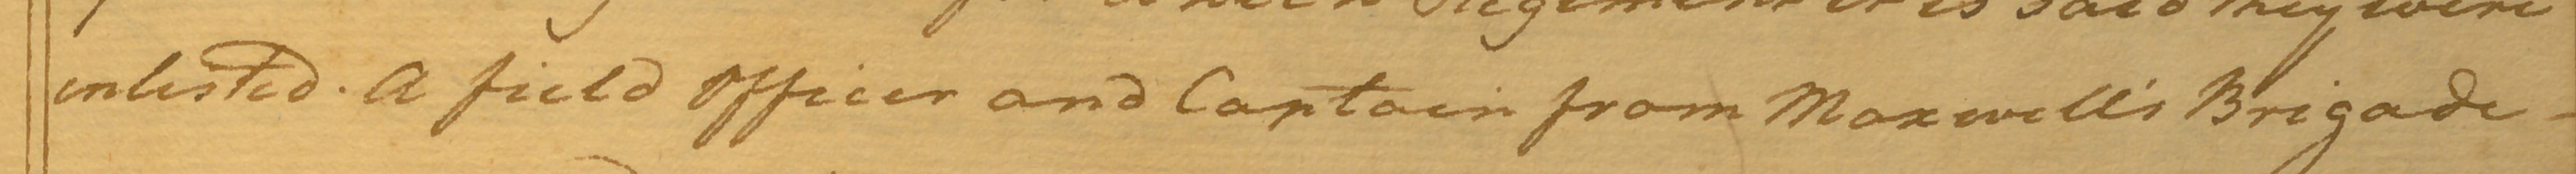enlisted. A field officer and Captain from Maxwell's Brigade
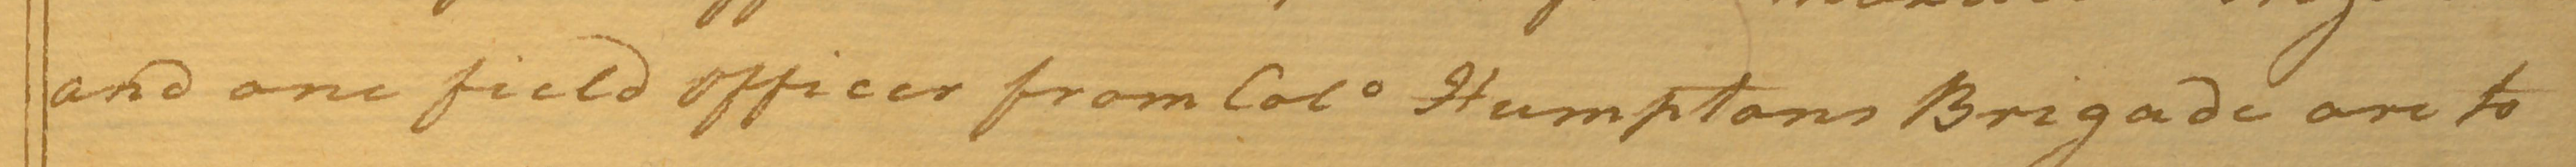and one field officer from Col^o Humptons Brigade are to
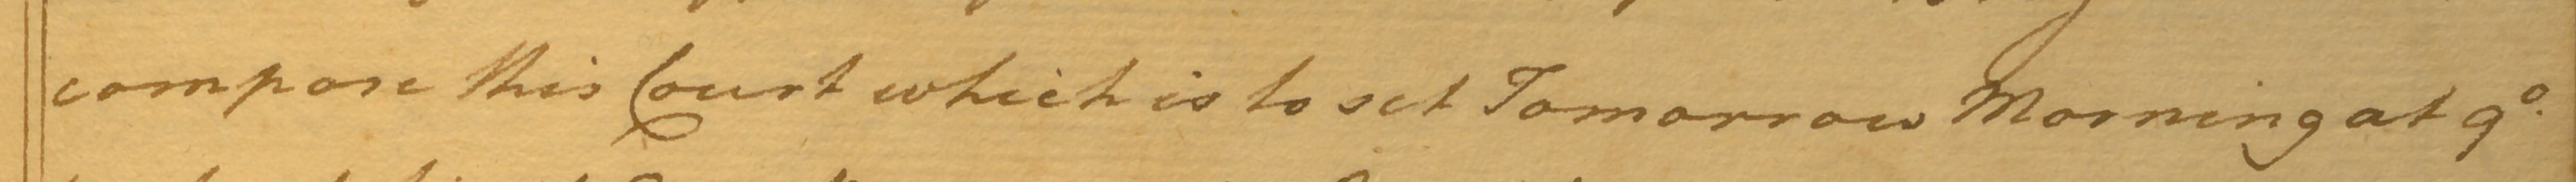compose this Court which is to set Tomorrow Morning at 9 ^o.
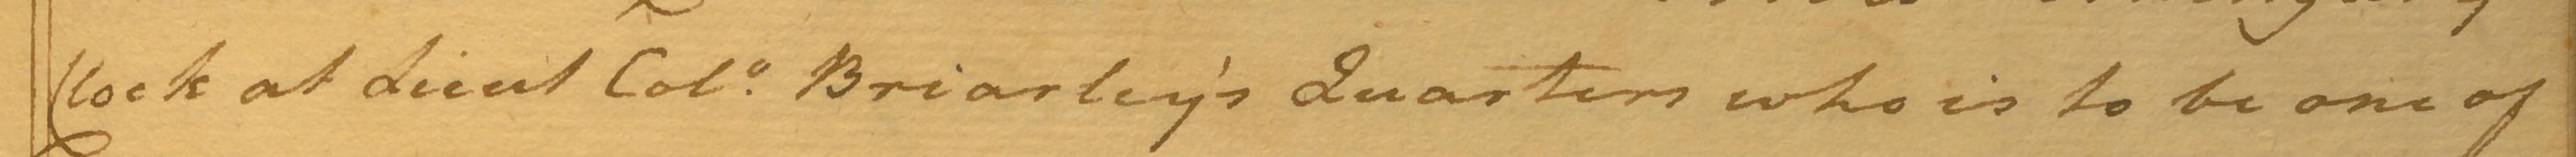Clock at Lieut Col^o. Briarley's Quarters who is to be one of
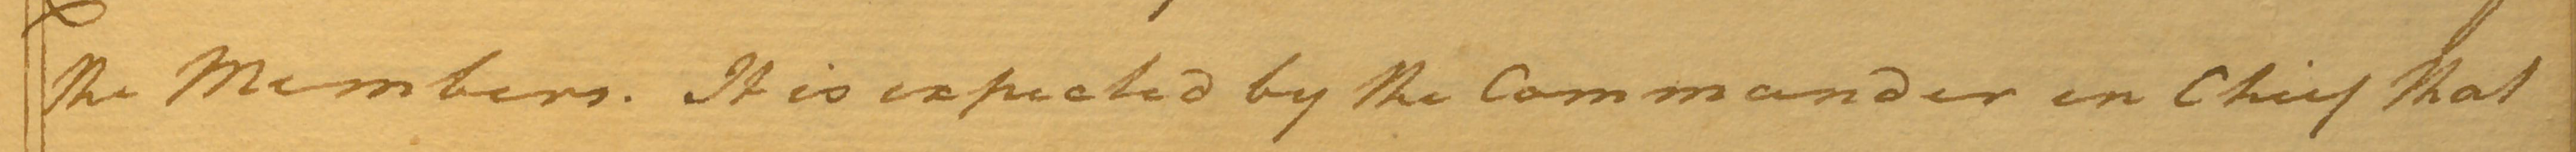the Members. It is expected by the Commander in Chief that
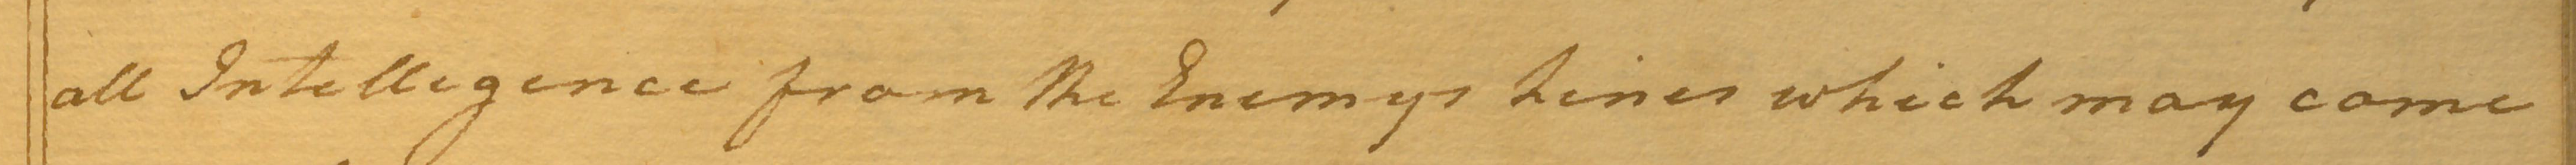all Intelligence from the Enemys Lines which may come
